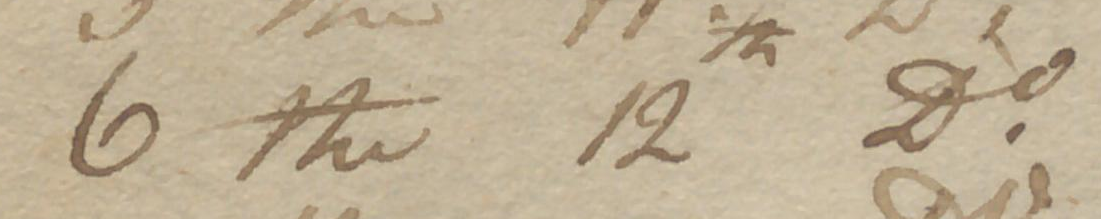6 the 12^th D^o.
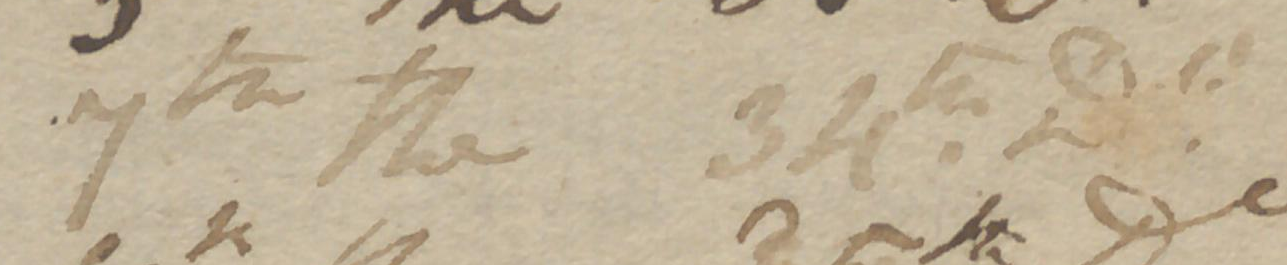7^th the 34^th. D^o.
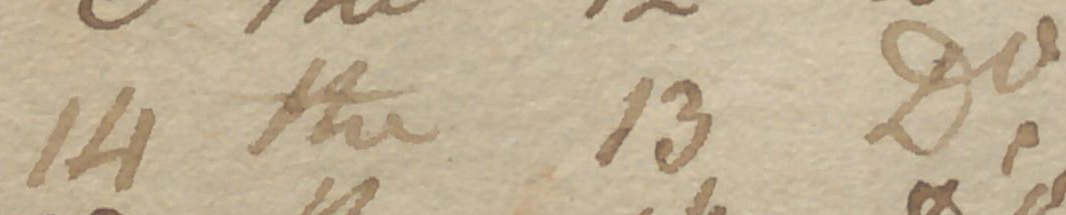14 th 13 D^o.
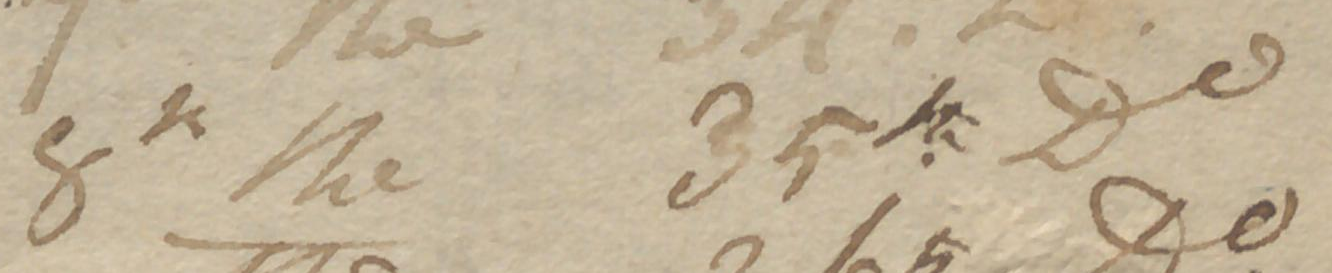8^th the 35^th. D^o
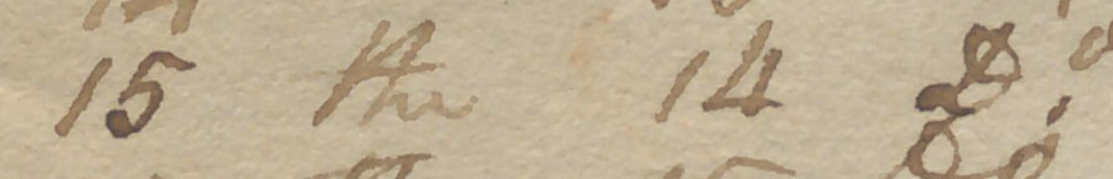15 the 14 D^o.
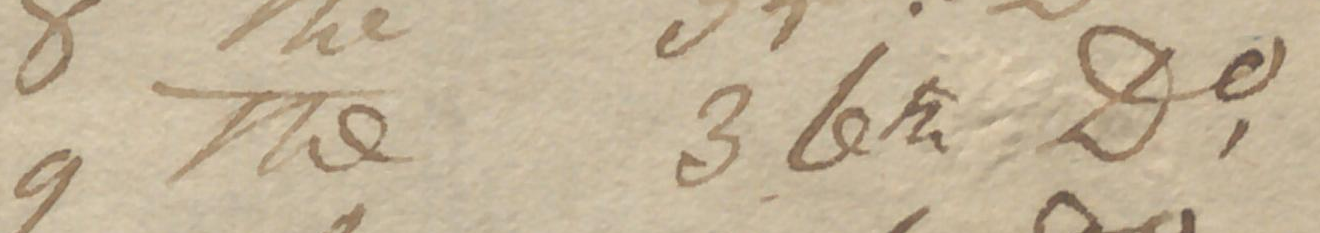9 the 36^th D^o.
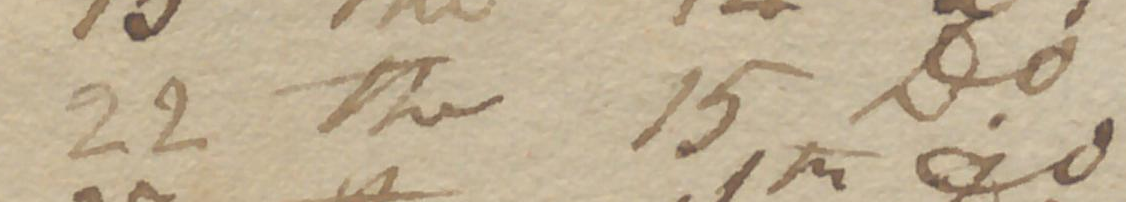22 the 15 D^o.
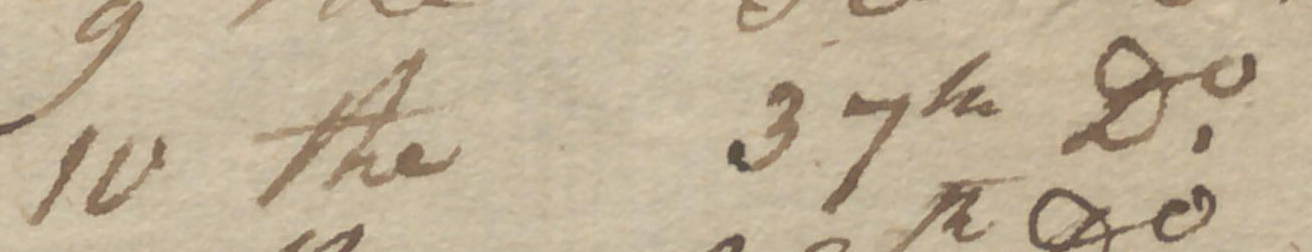10 the 37^th D^o.
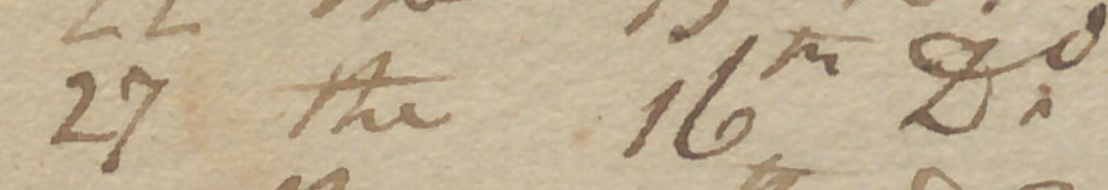27 the 16^th. D^o.
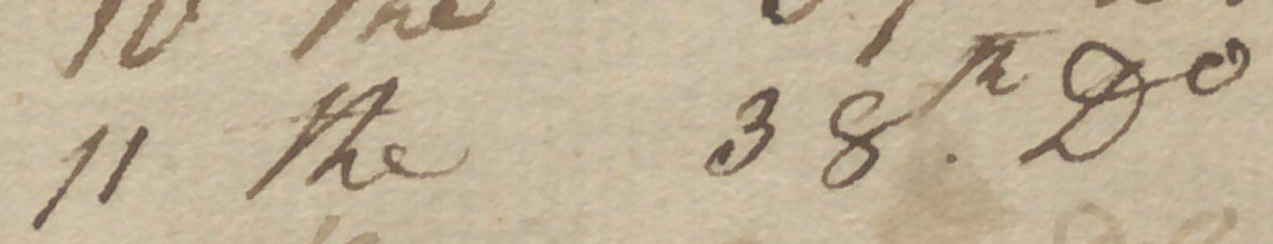11 the 38^th. D^o
